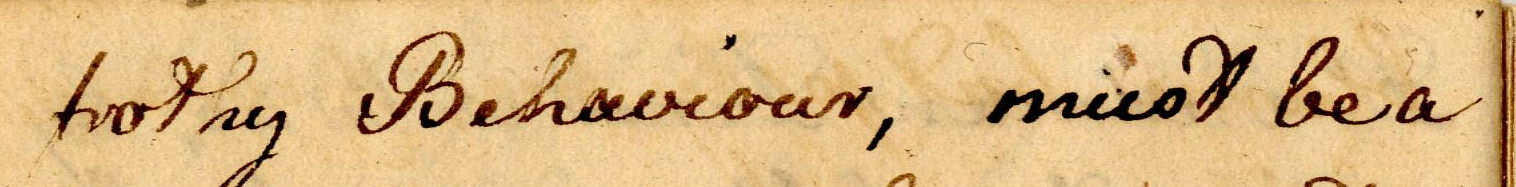trotry Behaviour, mast be a
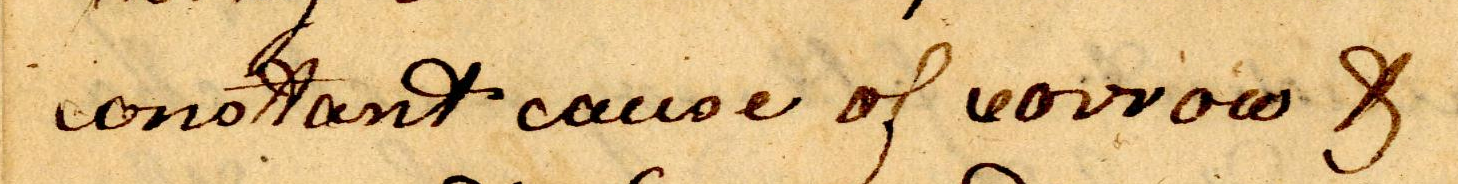constant cause of sorrow &
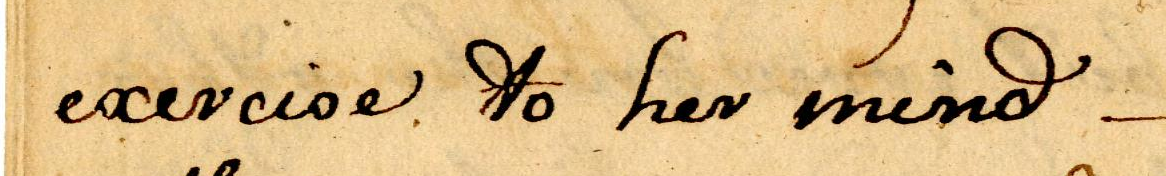exercise to her mind-
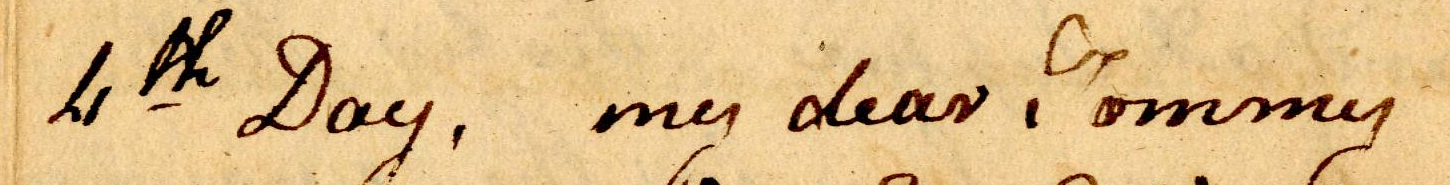4^th Day, my dear Tommy
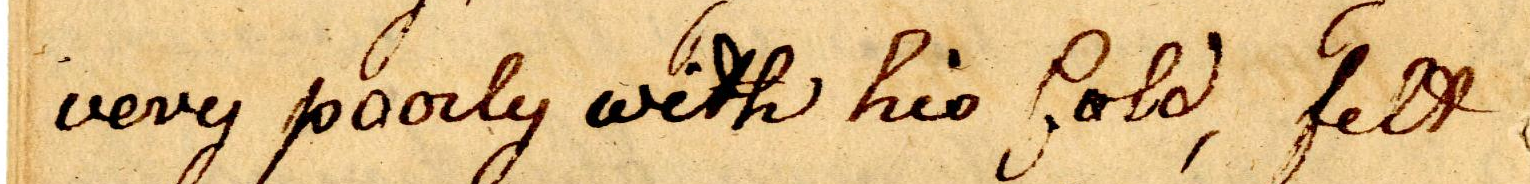very poorly with his Cold, felt
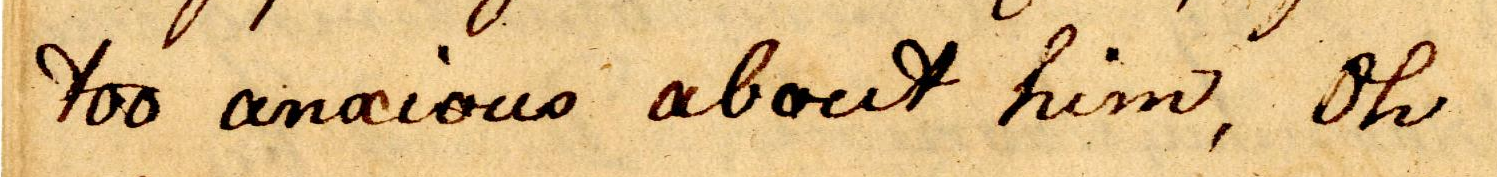too anxious about him, Oh
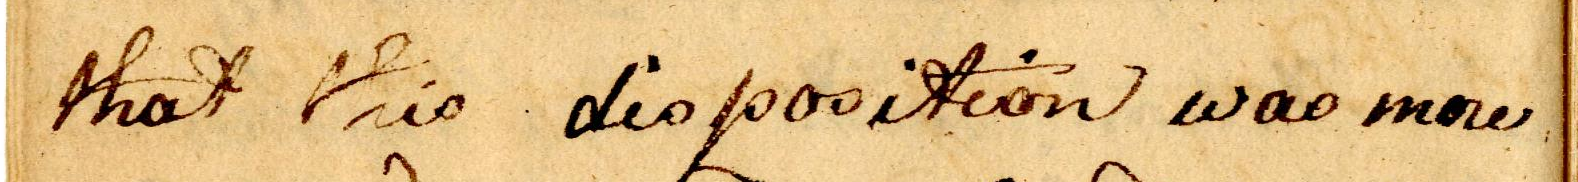that this disposition was more
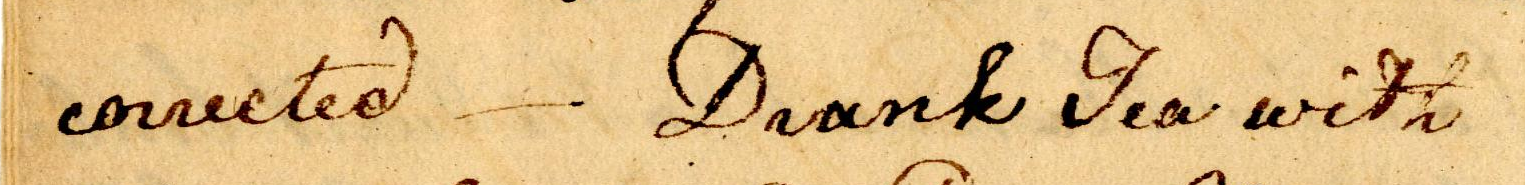corrected- Drank Tea with
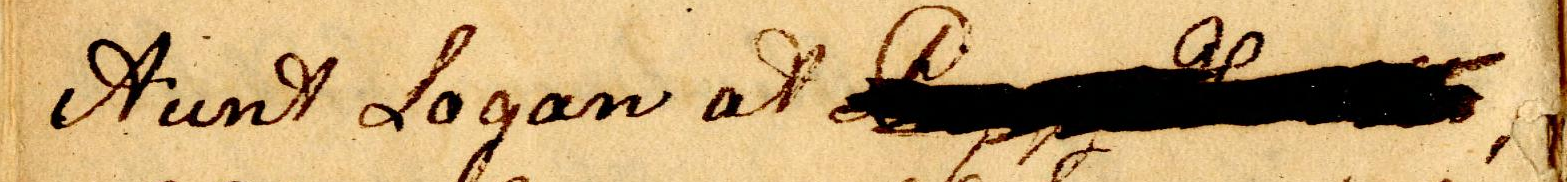Aunt Logan at [__________]
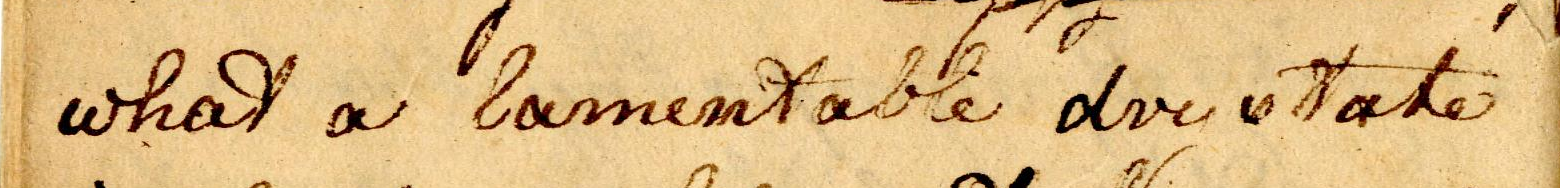what a lamentable dry state
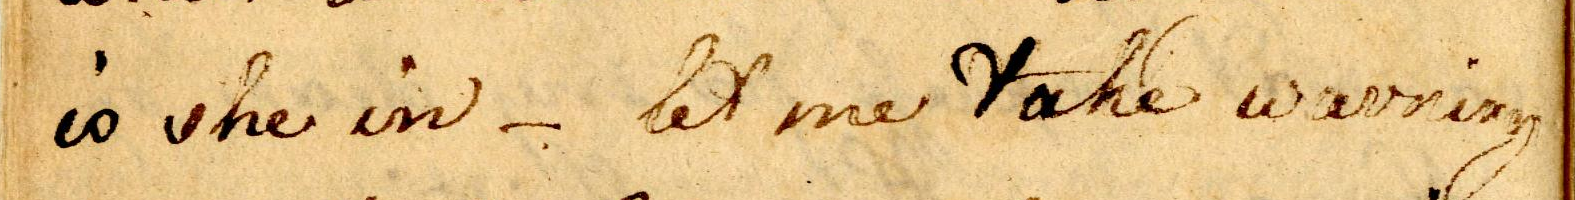is she in- let me take warning
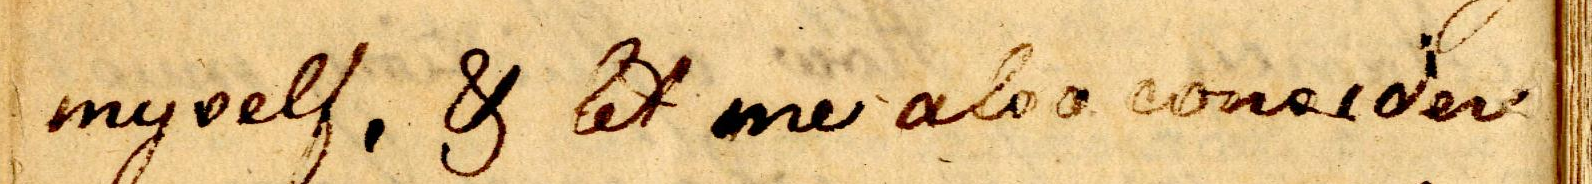myself, & let me also consider
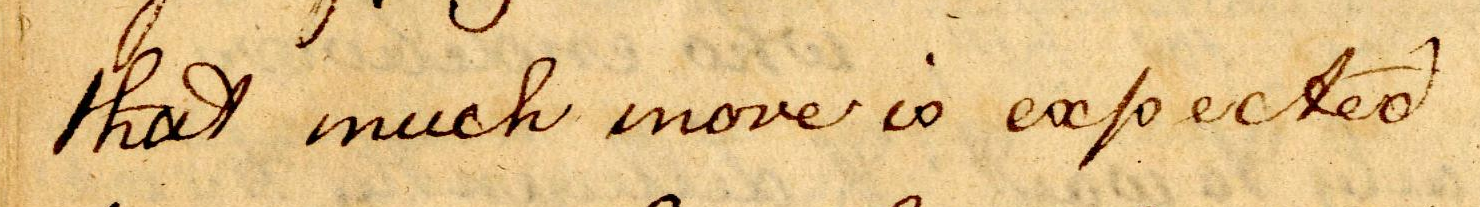that much more is expected
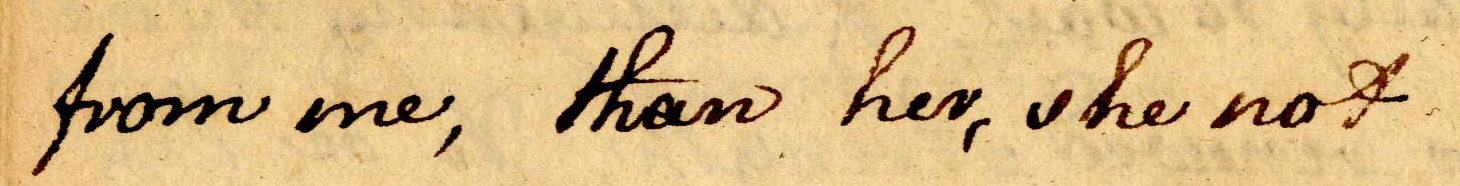from me, than her, she not
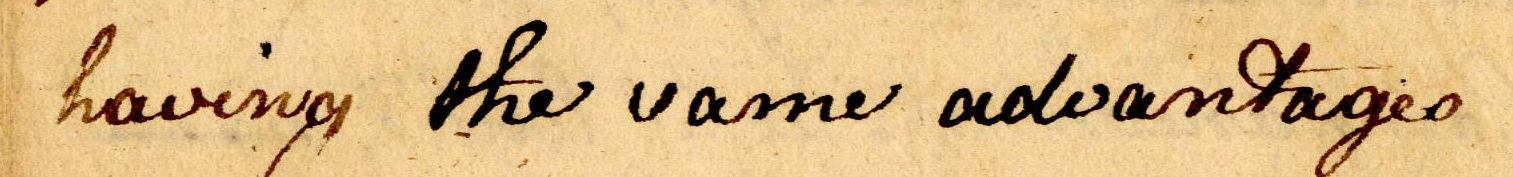having the same advantages
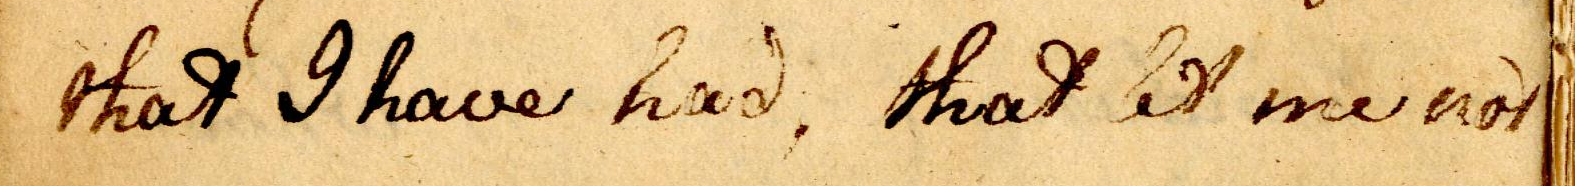that I have had, that let me not
